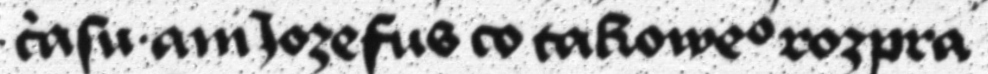ċaſu. ani Iozefus co takowe° rozprá
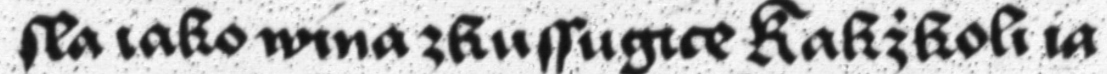ſla iako wína zkuſſugice Kakżkoli ia
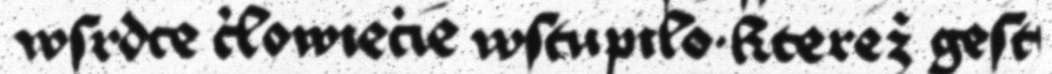wſrdce ċlowieċíe wſtupilo. kteréż geſt
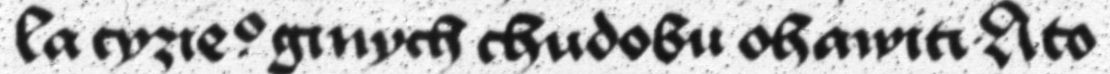la cyzíe° ginych chudobu ohawiti. A to
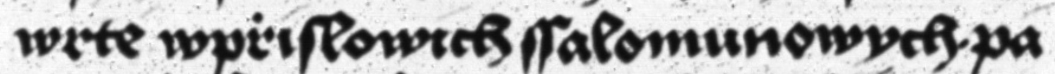wrté wpříſlowích ſſalomunowych. pá
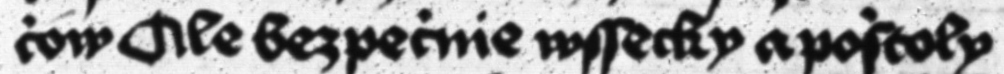ċów Ale bezpeċnie wſſecky apoẛtoly
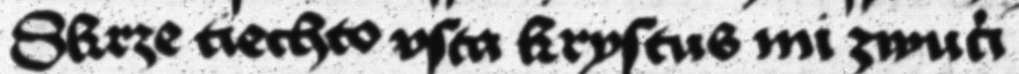Skrze tiechto vſta kryſtus mi zwuċí
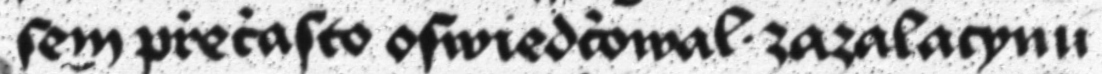ſem pṙeċaſto oſwiedċowal. zazalacynu
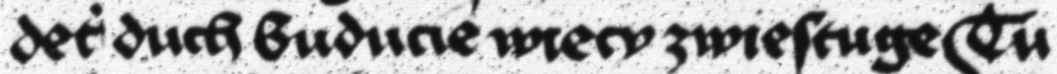deṫ duch buducíe wiecy zwieſtuge Tu
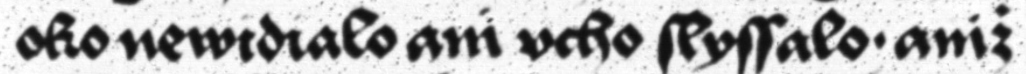oko newidialo ani vcho ſlyſſalo. aniż
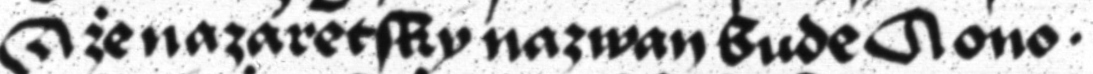A że nazáretſký nazwán bude A ono.
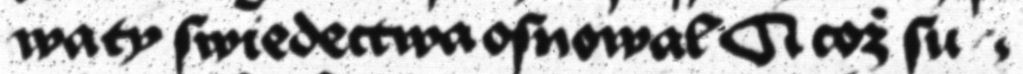waty ſwiedectwa oſnowal A coż ſu
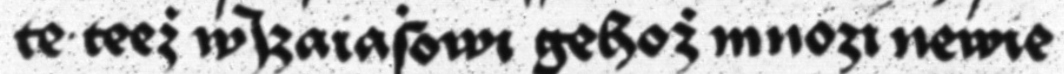te. teeż wIzaiaẛowi gehoż mnozí newie
